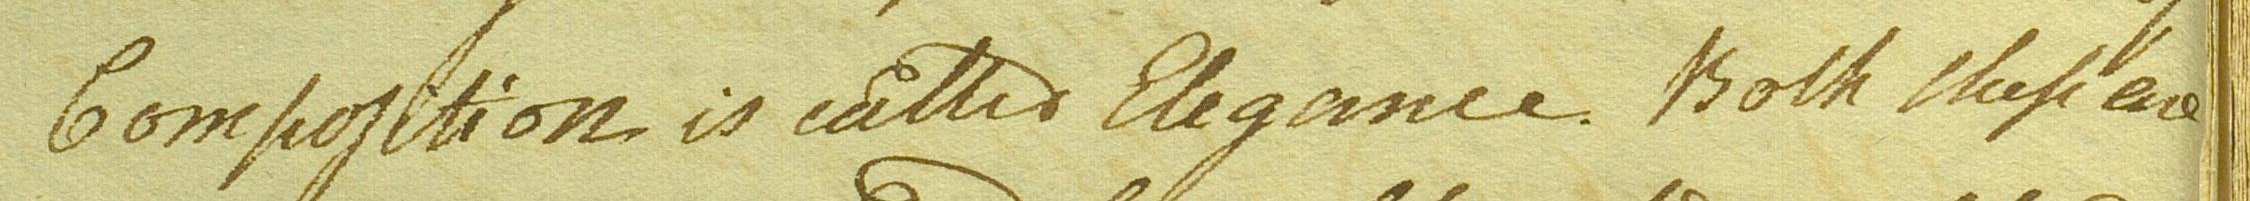Composition is called Elegance. Both these are
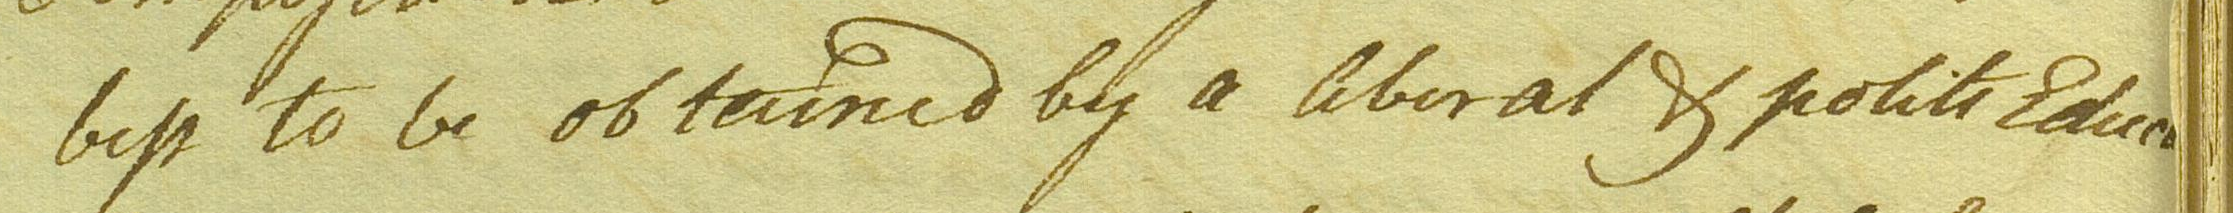best to be obtained by a liberal & polite Educa
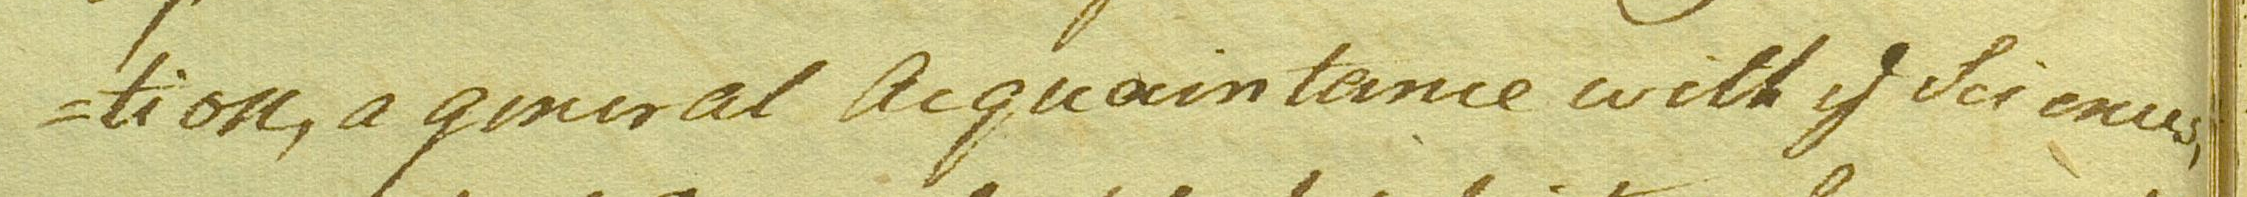-tion, a general Acquaintance with y^e Sciences,
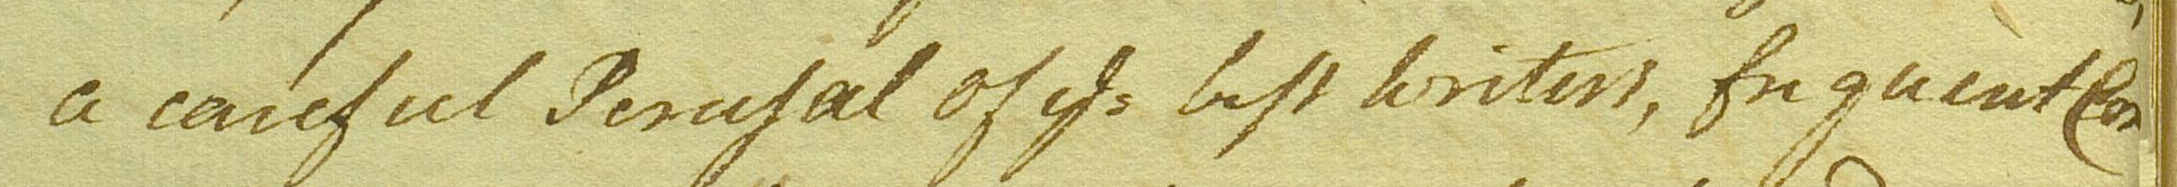a careful Perusal of y^e best writers, frequent Con
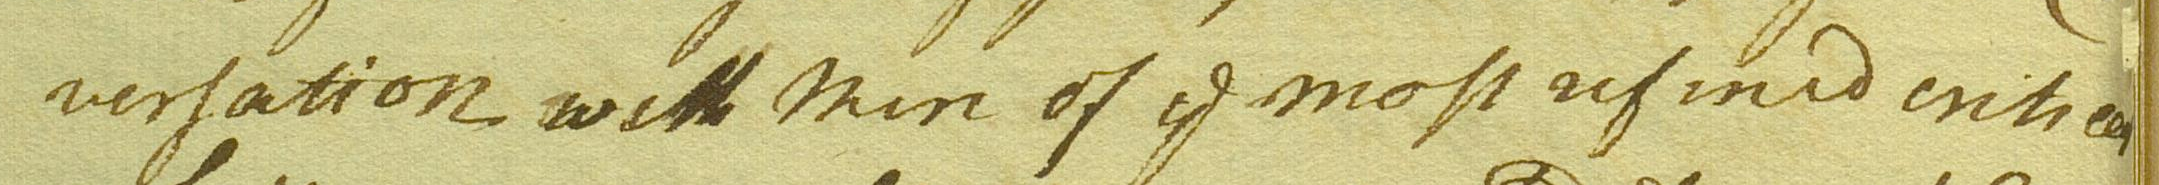versation with Men of y^e most refined entre
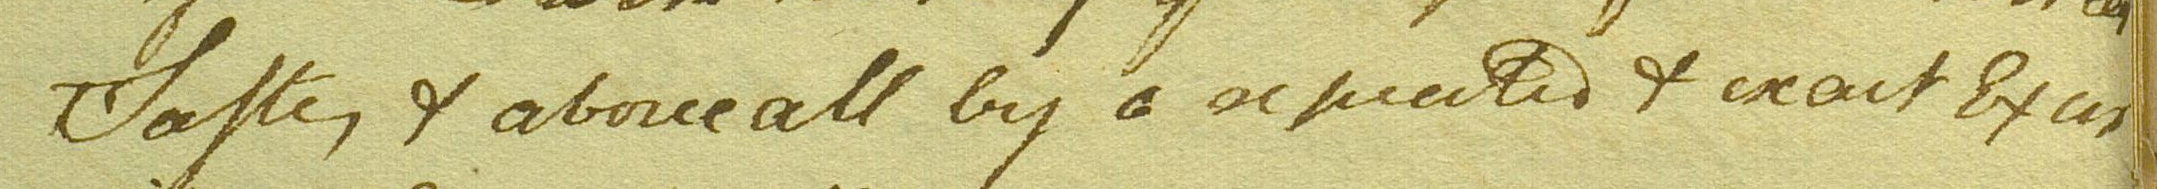Tastes & above all by a repeated & exact Excer
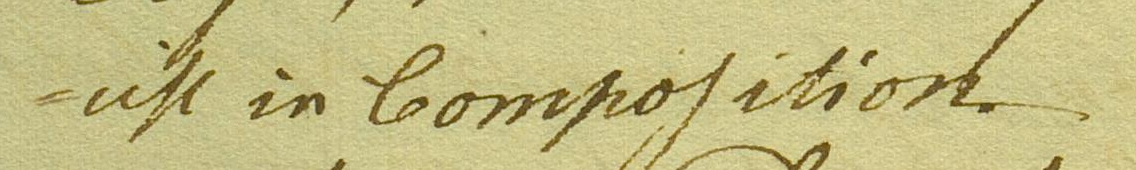-cise in Composition.
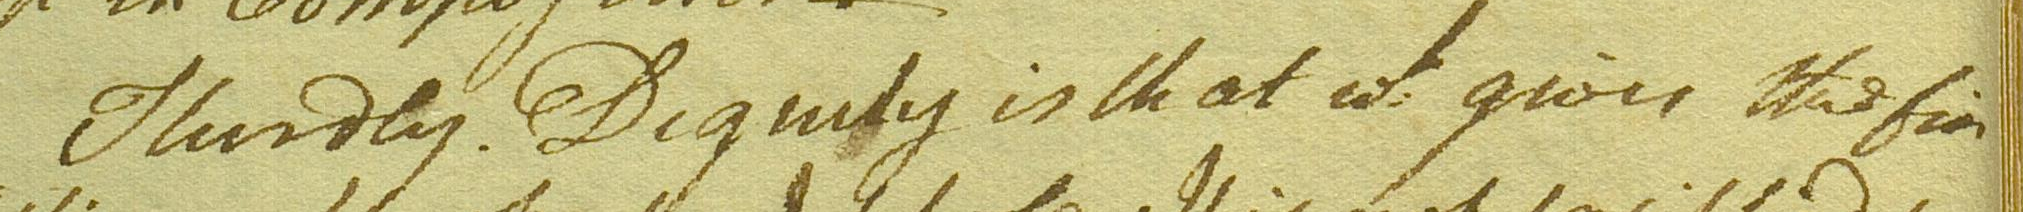Thirdly. Dignity is that w^h: gives that fin
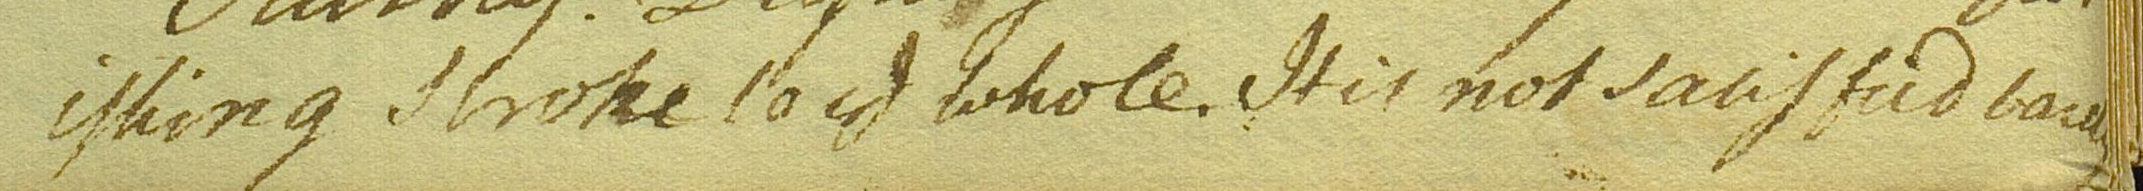ishing stroke to ye whole. It is not satisfied bard
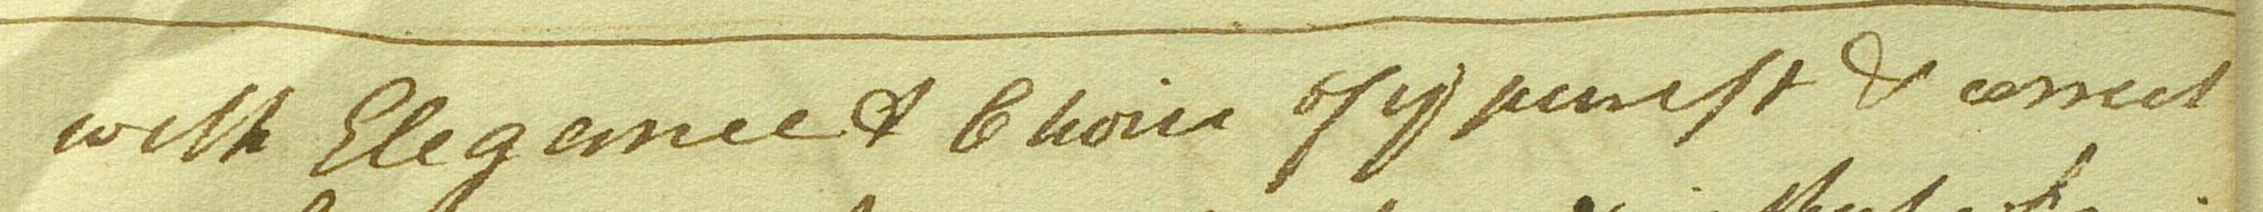with Elegance & Choice of y^e purest & correct
